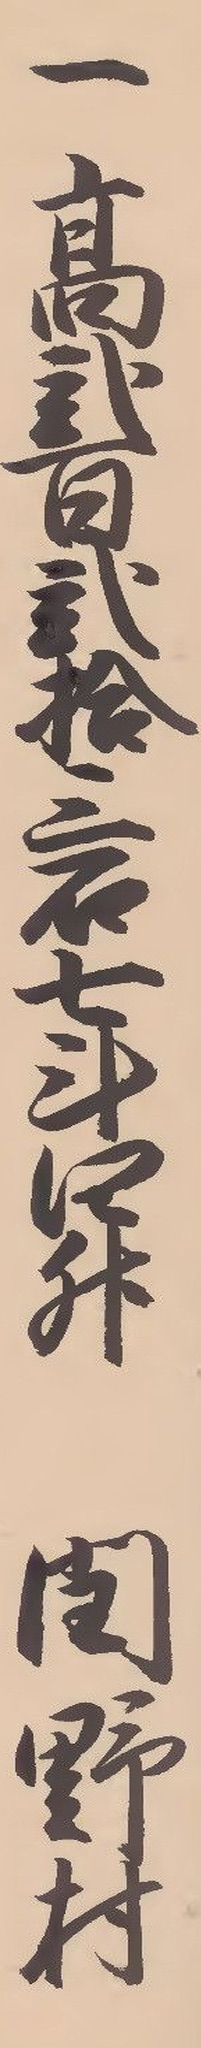一高弐百弐拾三石七斗四升閏野村
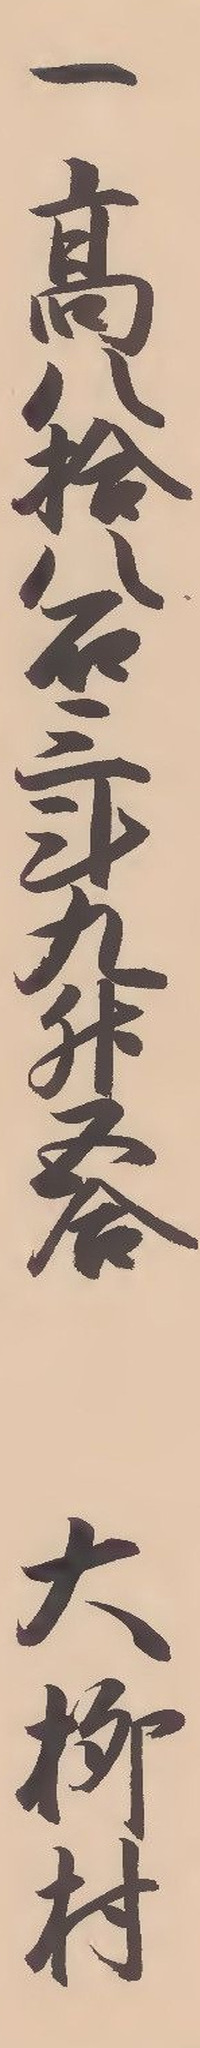一高八拾八石三斗九升五合大柳村
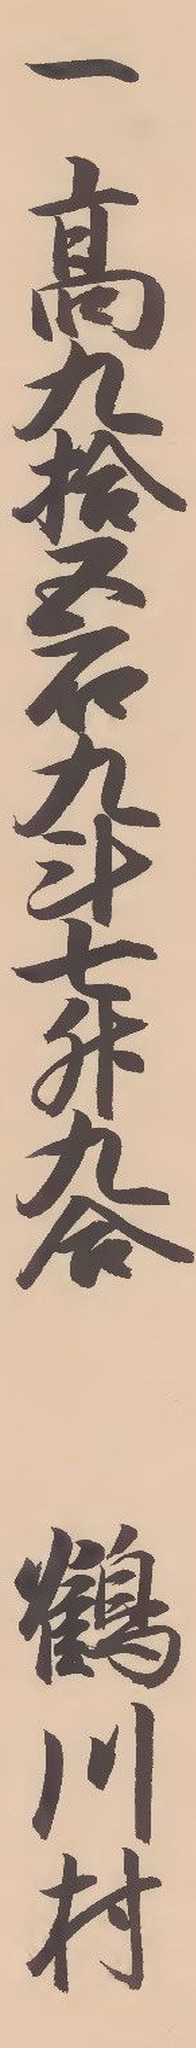一高九拾五石九斗七升九合鶴川村
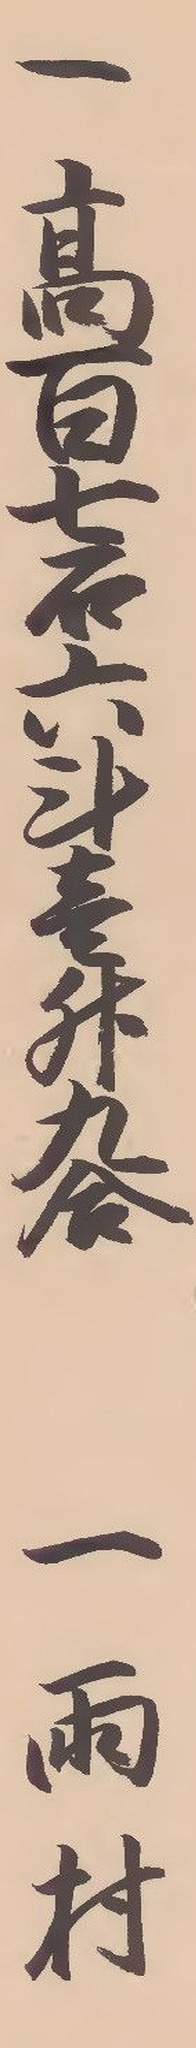一高百七石六斗壱升九合一雨村

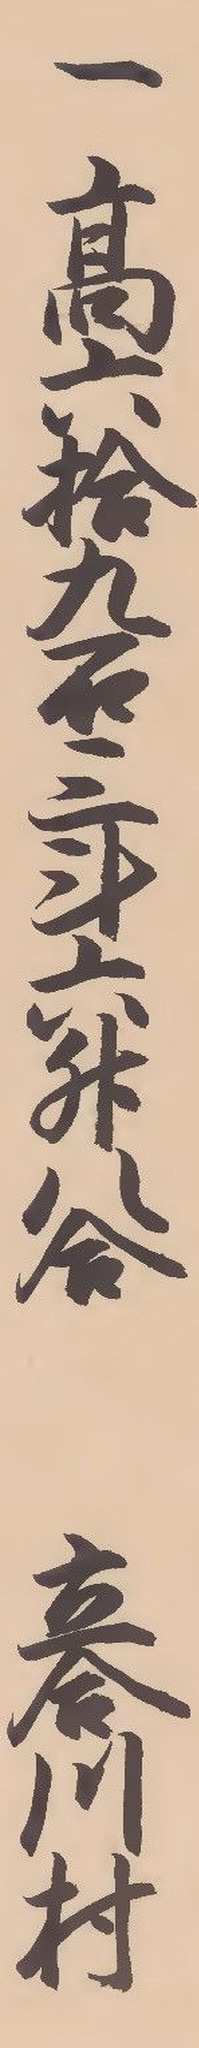一高六拾九石三斗六升八合立合川村
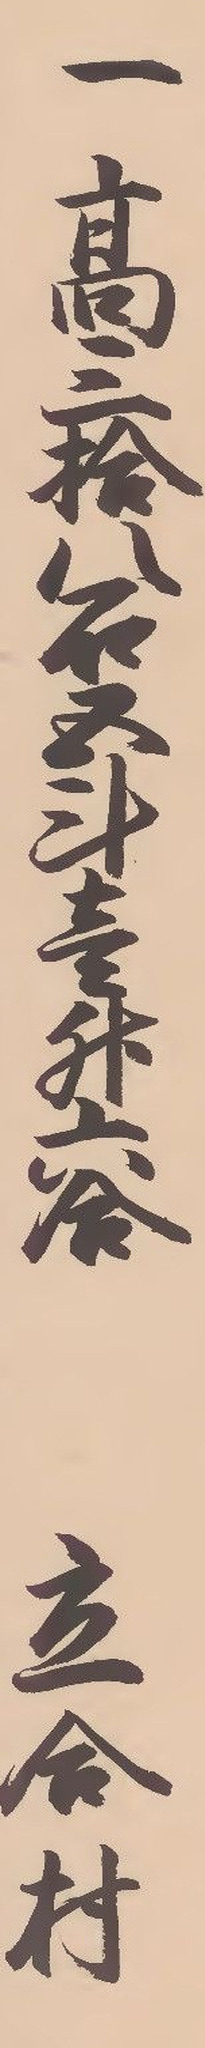一高三拾八石五斗壱升六合立合村
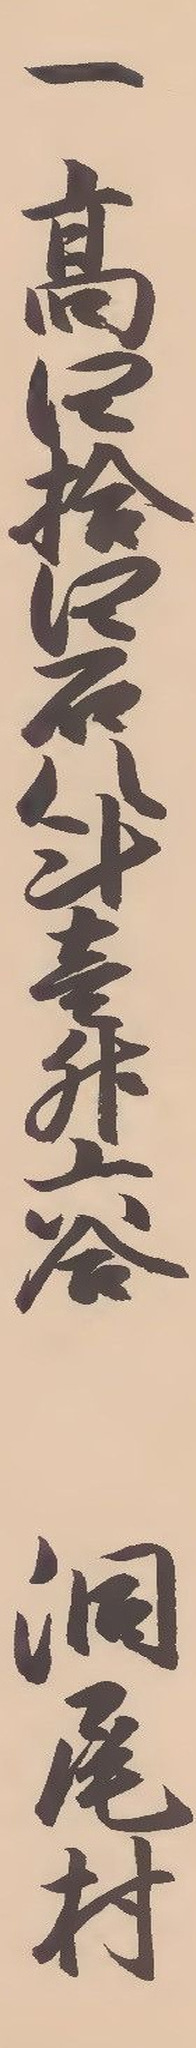一高四拾四石八斗壱升六合洞尾村
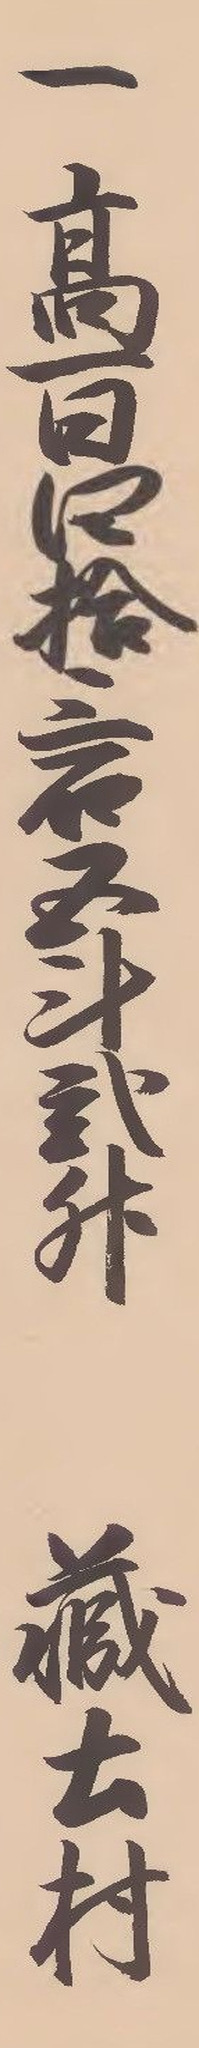一高百四拾三石五斗弐升蔵土村

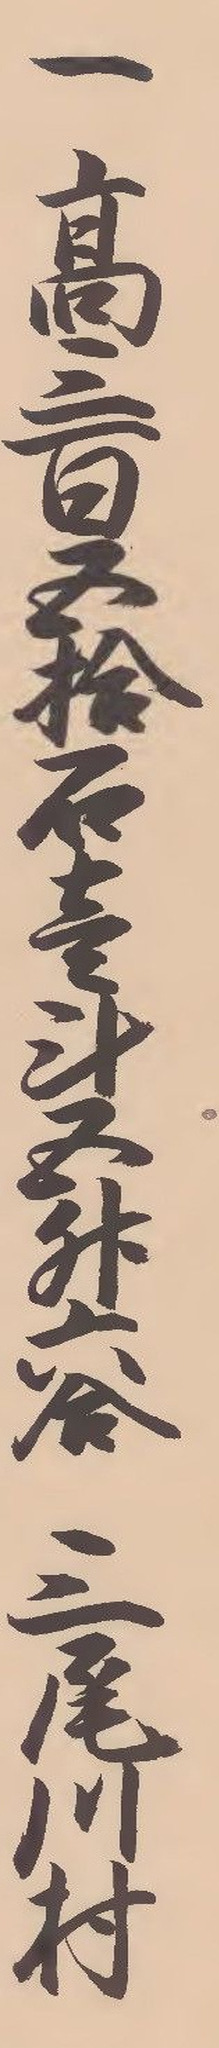一高三百五拾石壱斗五升六合三尾川村
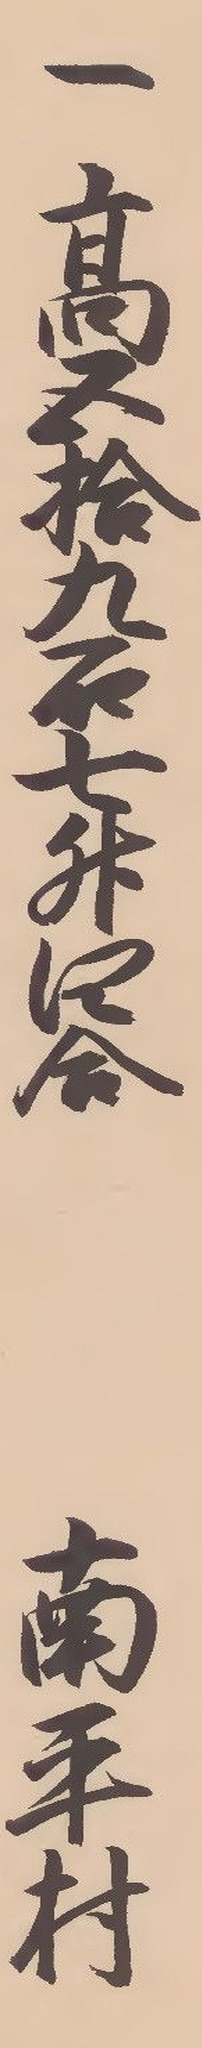一高五拾九石七升四合南平村
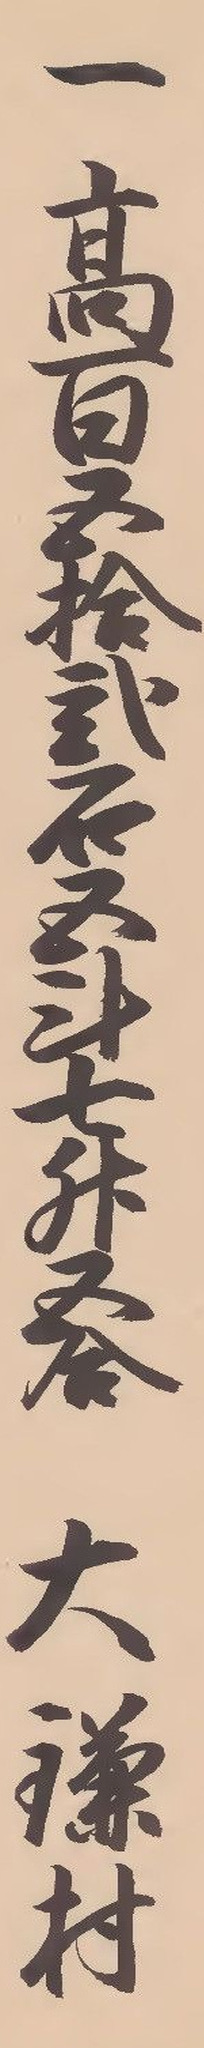一高百五拾弐石五斗七升五合大鎌村
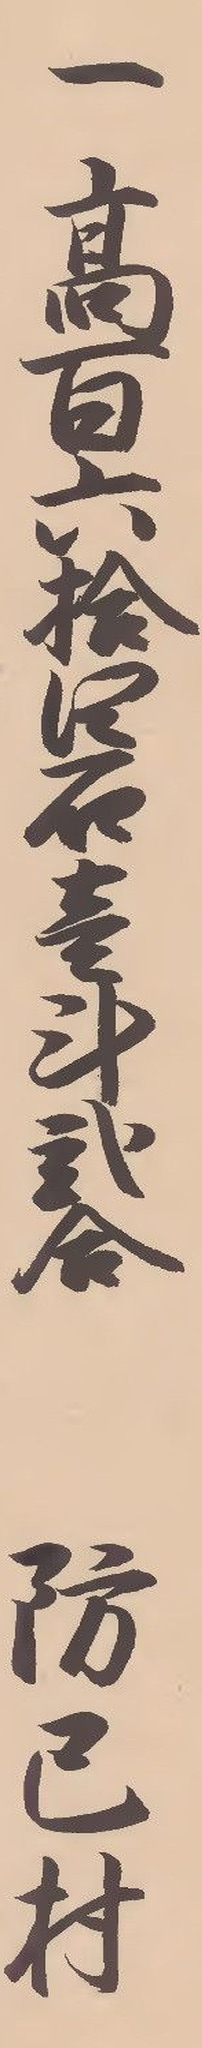一高百六拾四石壱斗弐合防己村
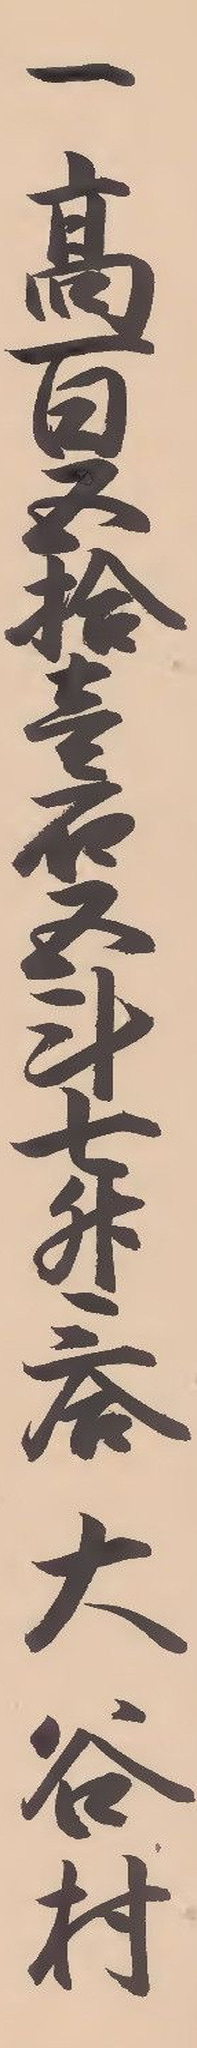一高百五拾壱石五斗七升三合大谷村
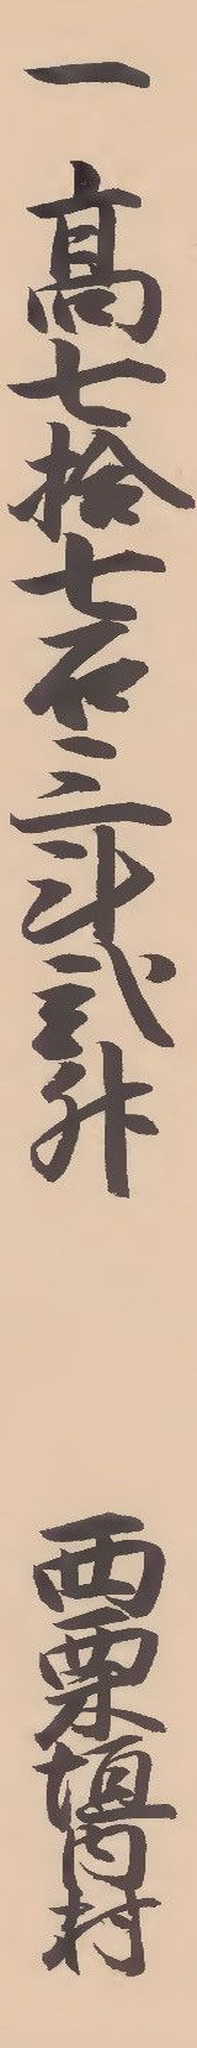一高七拾七石三斗弐升西栗垣内村

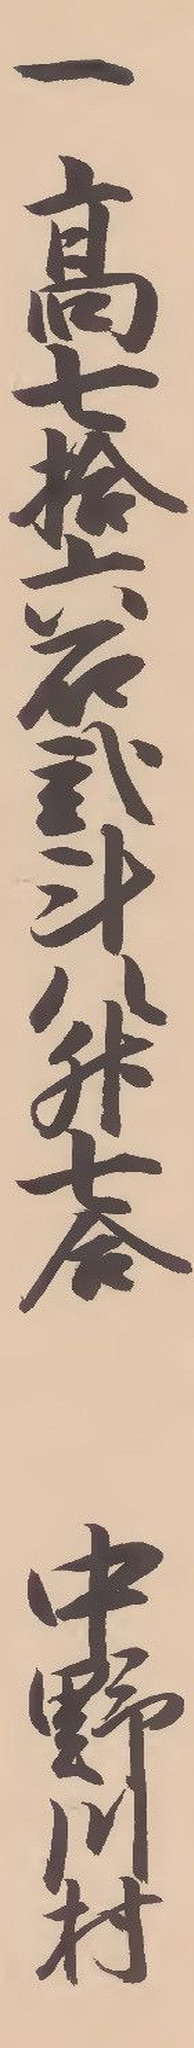一高七拾六石弐斗八升七合中野川村
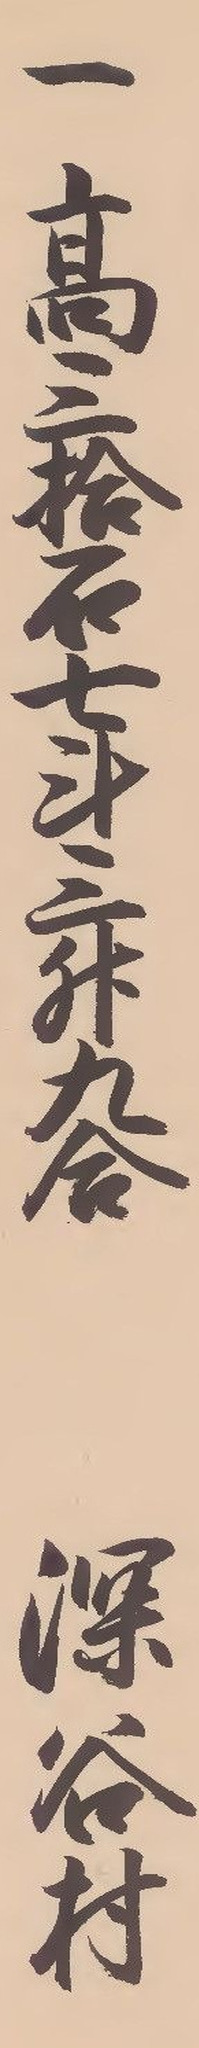一高三拾石七斗三升九合深谷村
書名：紀伊国郷帳
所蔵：国立公文書館 National Archives of Japan
